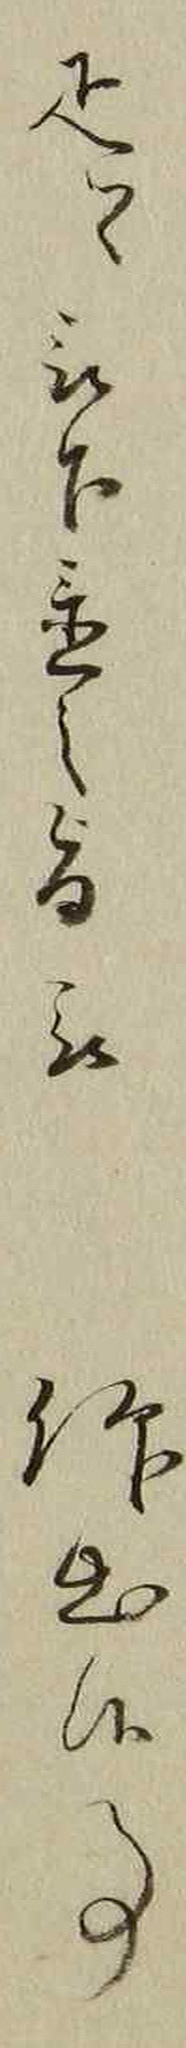疋ツヽ被下置之旨被仰出候事
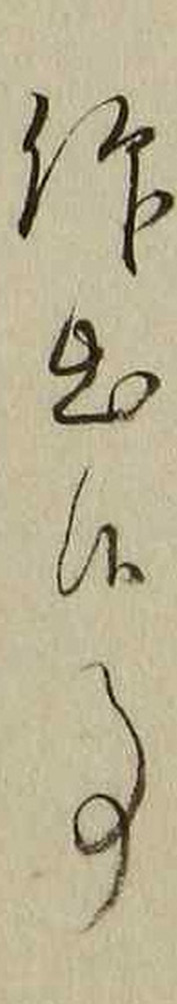仰出候事
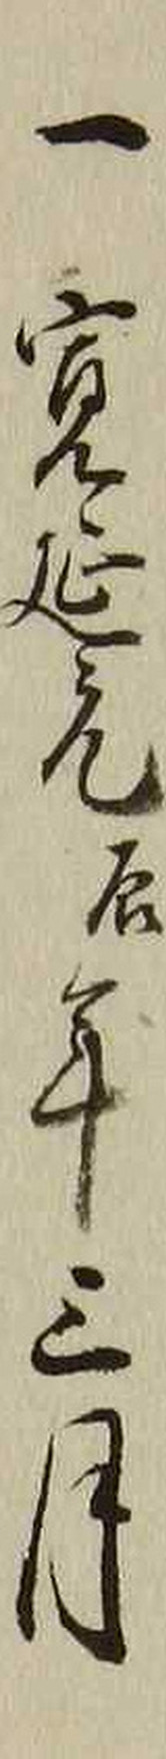一寛延元辰年三月
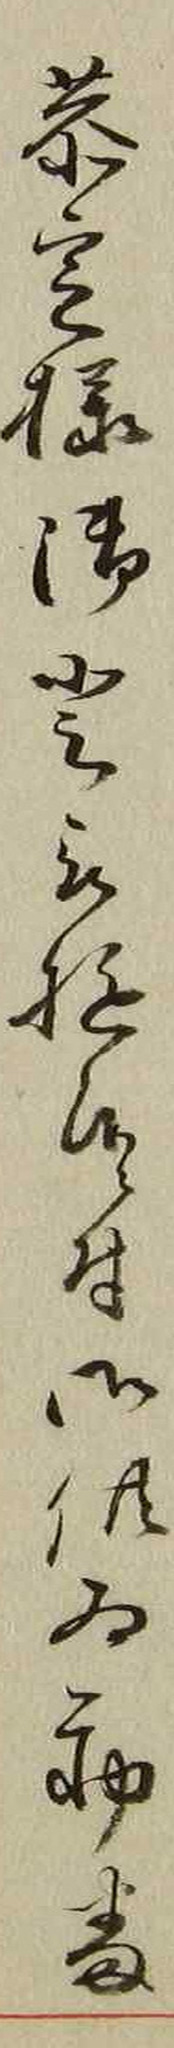恭定様御登被遊候ニ付御供為勤番
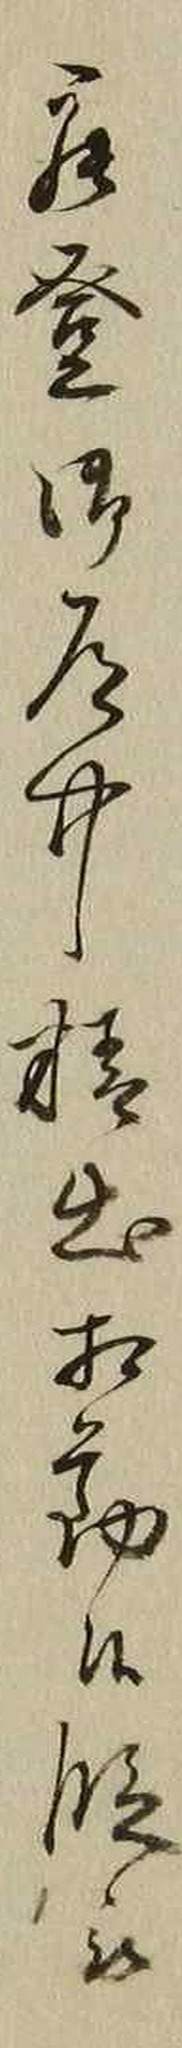罷登御道中精出相勤候段被
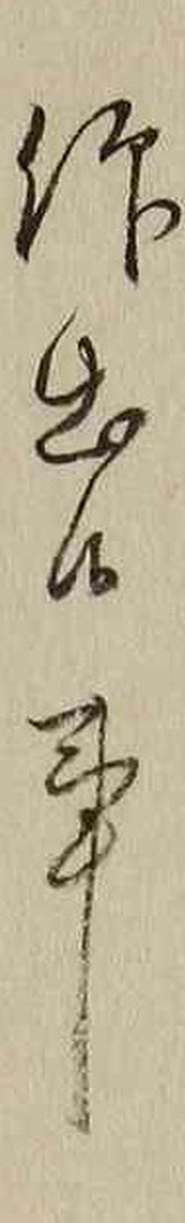仰出候事
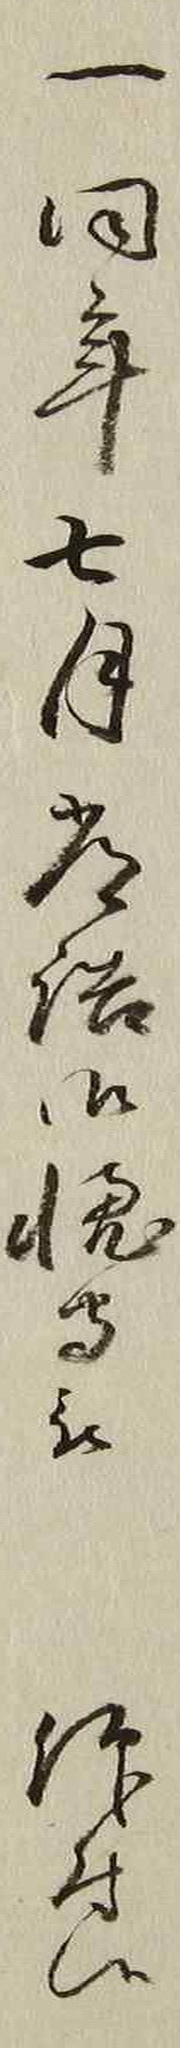一同年七月常詰御懐守被仰付候
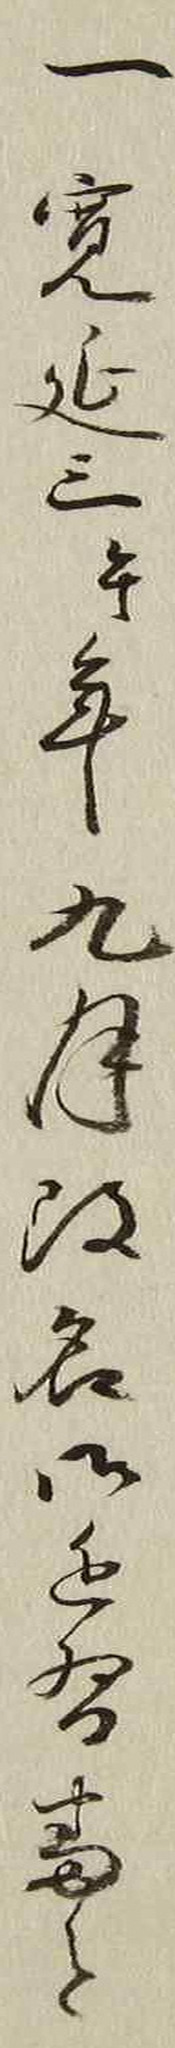一寛延三午年九月改名御近習番と
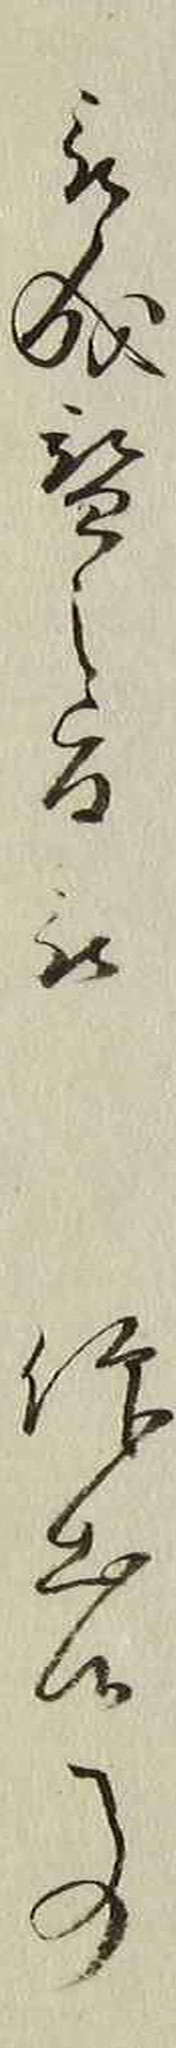被成替之旨被仰出候事
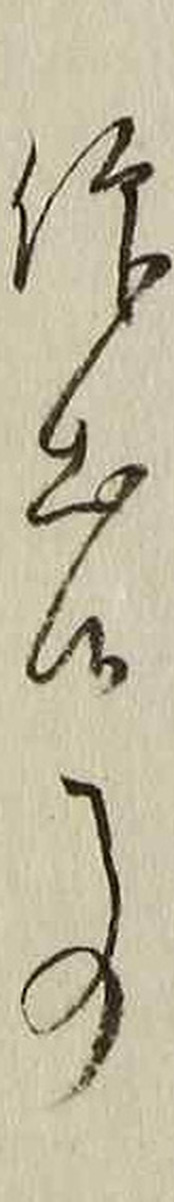仰出候事
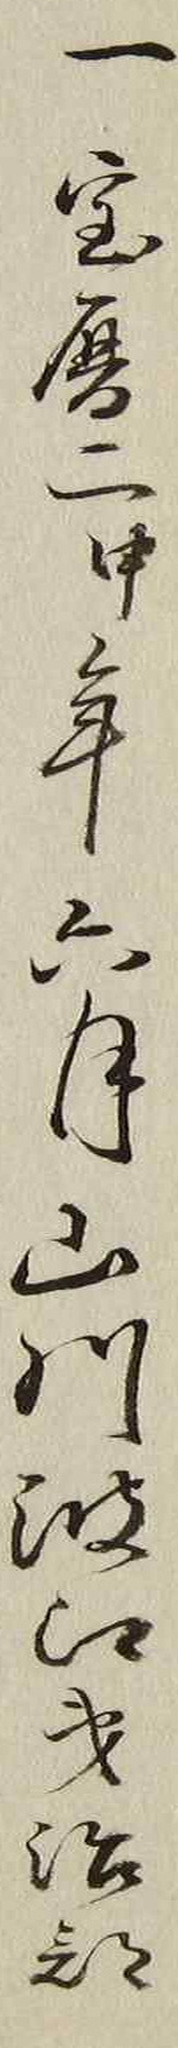一宝暦二申年六月山川波江弟治部
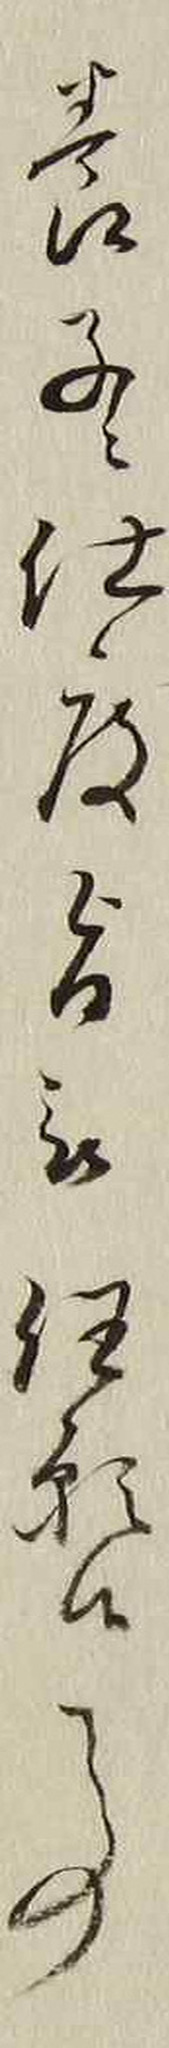養子ニ仕度旨被任願候事
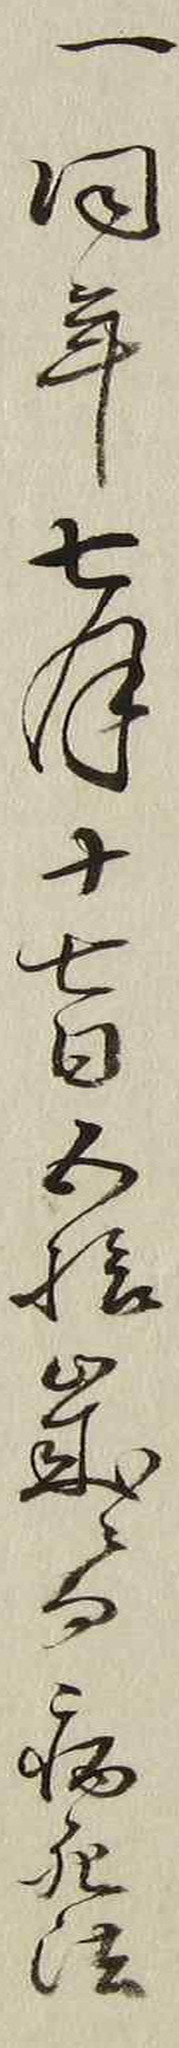一同年七月十七日五拾歳ニ而病死法
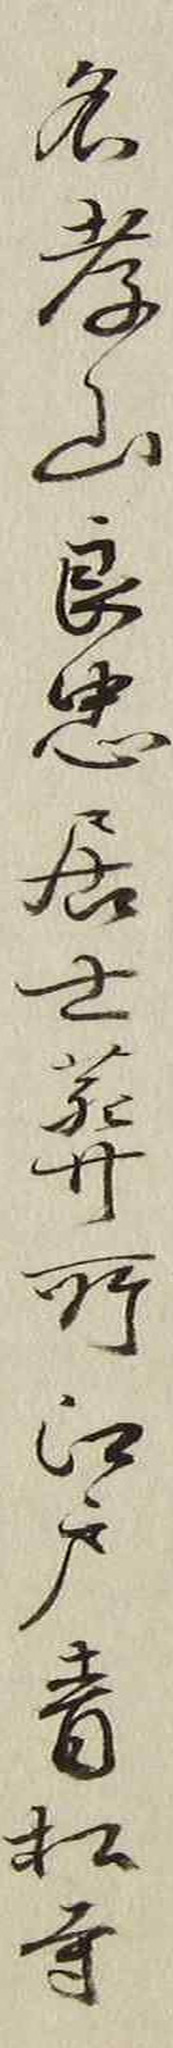名孝山良忠居士葬所江戸青松寺
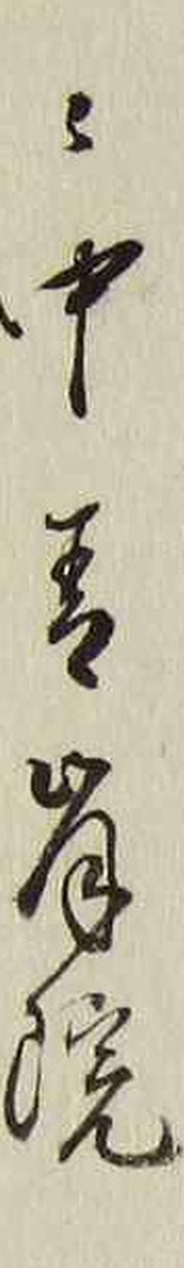之中青岸院

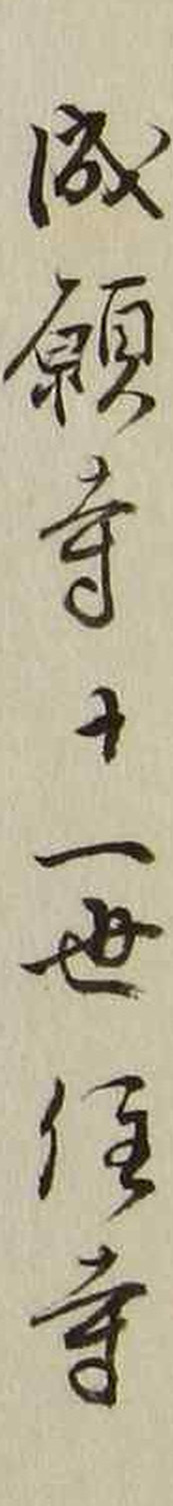成願寺十一世住持
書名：諸士系譜　巻之4　い之部4
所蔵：会津若松市立会津図書館
